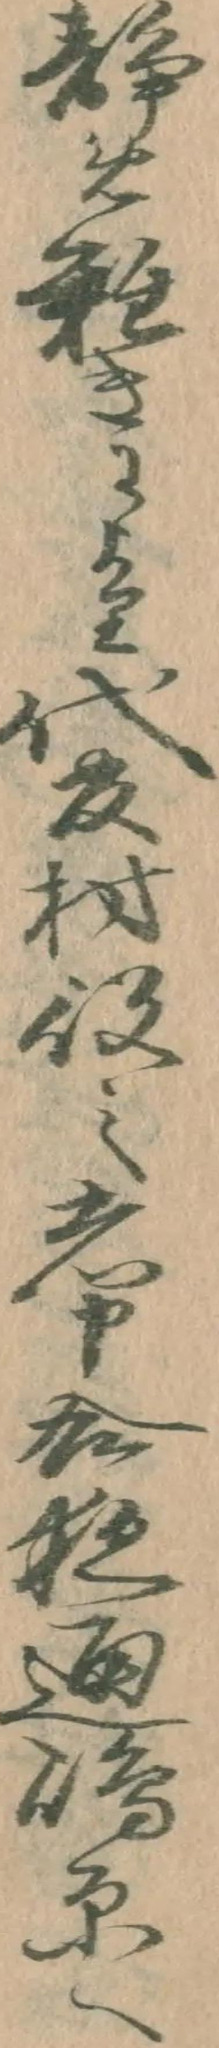静め難きにより代官村役之者申合夜通島原へ
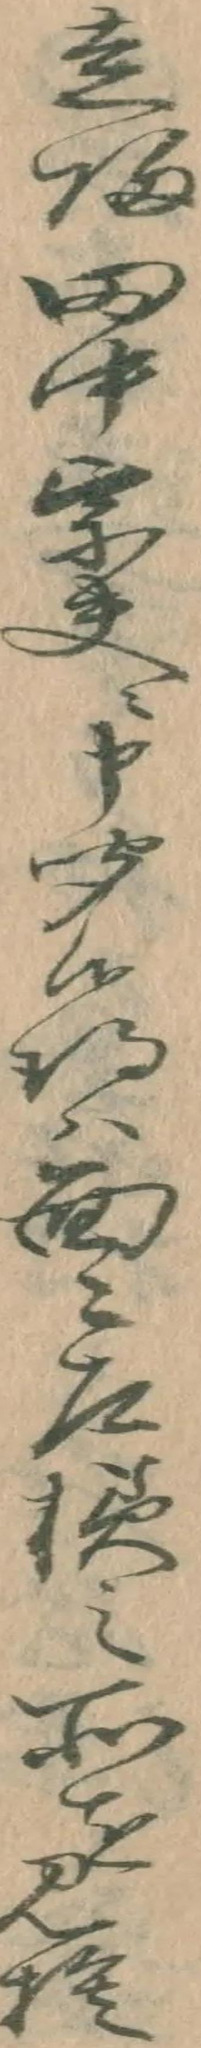走帰田中宗夫に申聞候得は面々左様之所を見捨
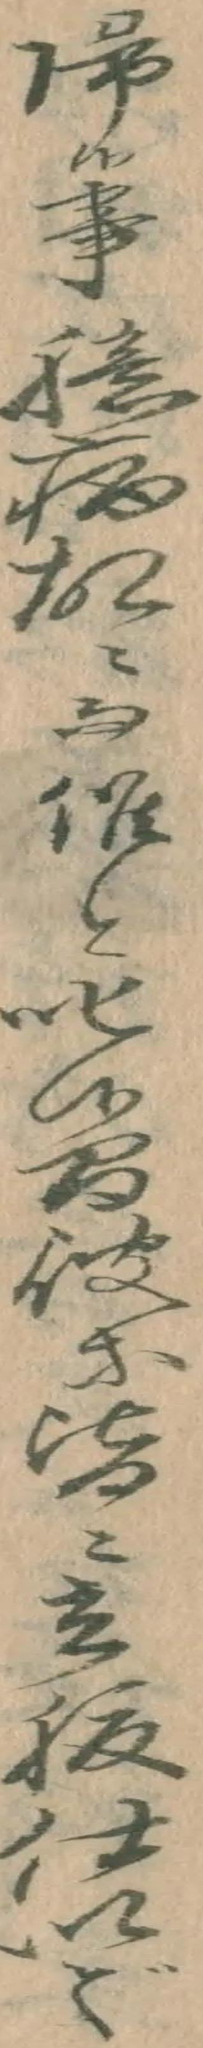帰候事臆病故に而候と叱候間彼等皆々立腹仕いで
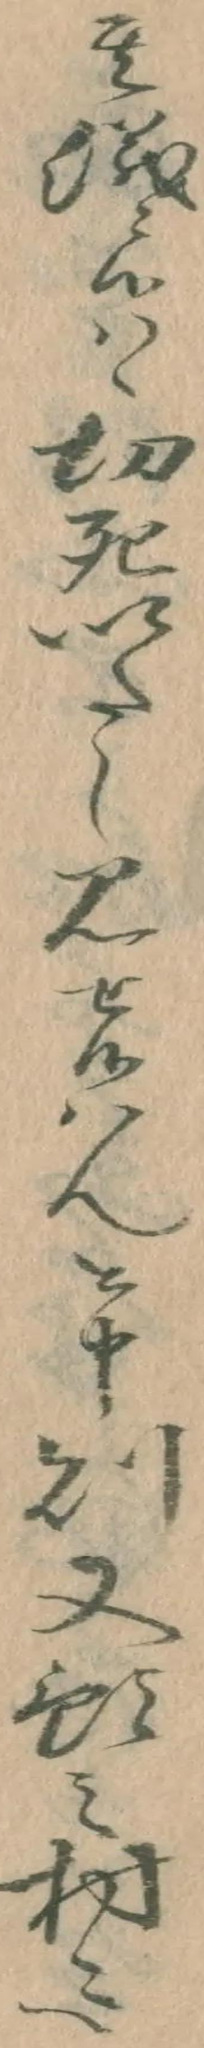其儀に候はゝ切死いたし見せ候はんと申則又領之村々へ
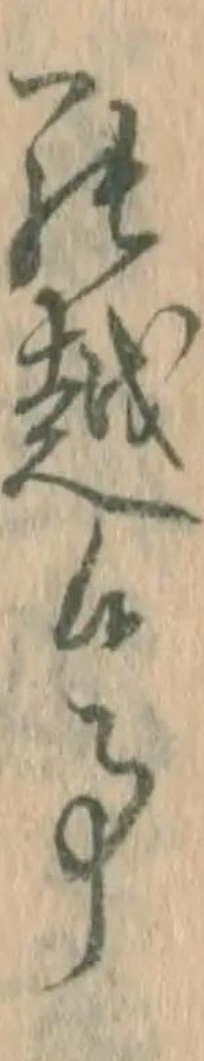罷越候事
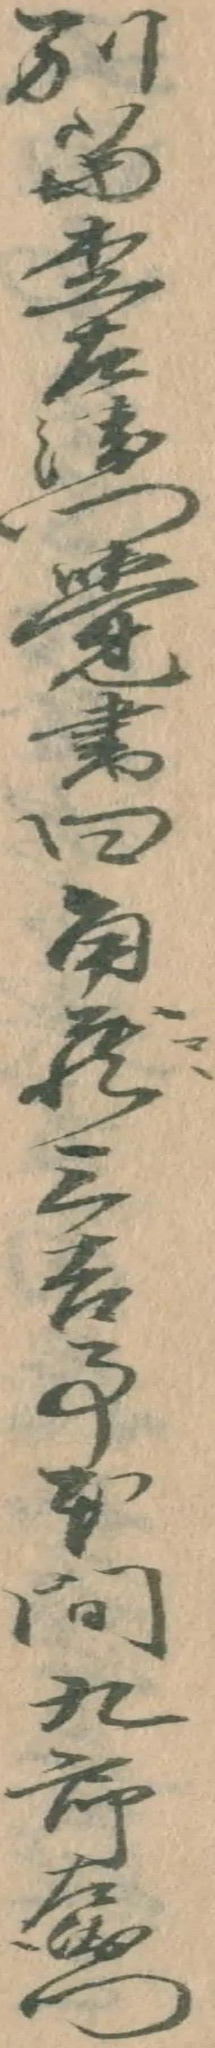別当杢左衛門覚書日角蔵三吉事本間九郎左衛門
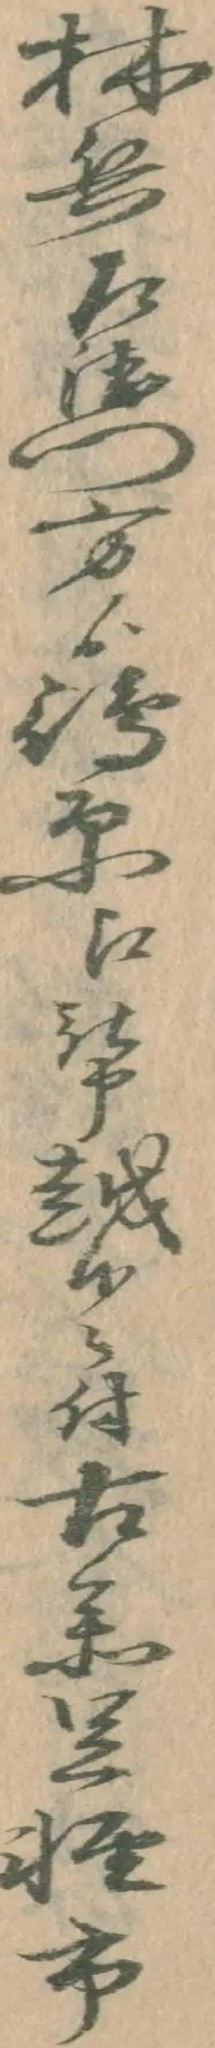林兵左衛門方ゟ島原え被申越候に付古参足軽市
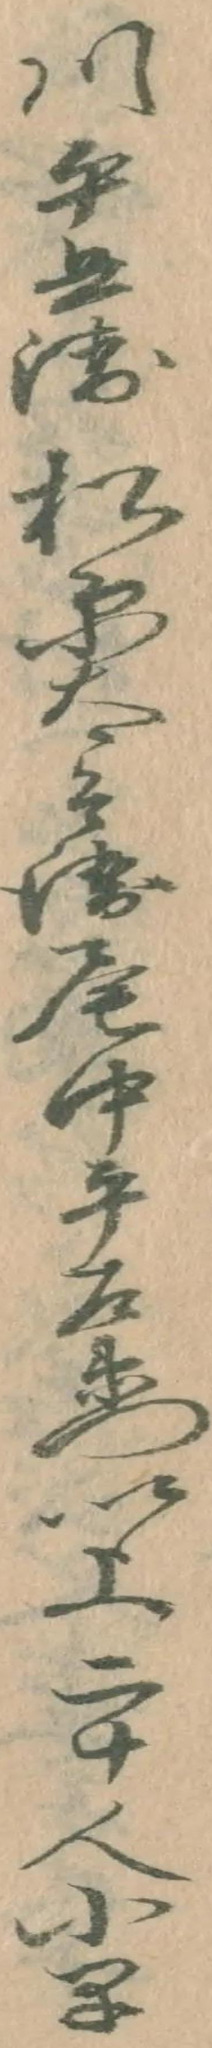川平兵衛松原太兵衛尾中平左衛門以上二十人小早

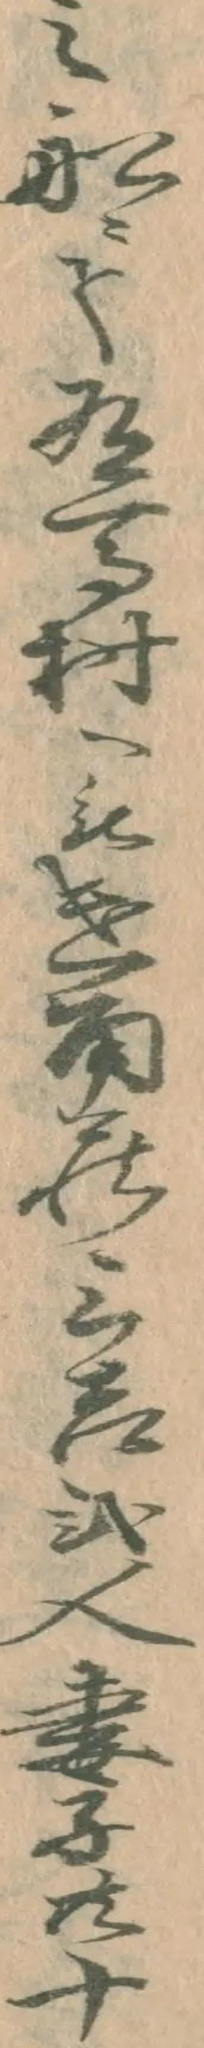之船にて有馬村へ被遣角蔵三吉弐人妻子共十
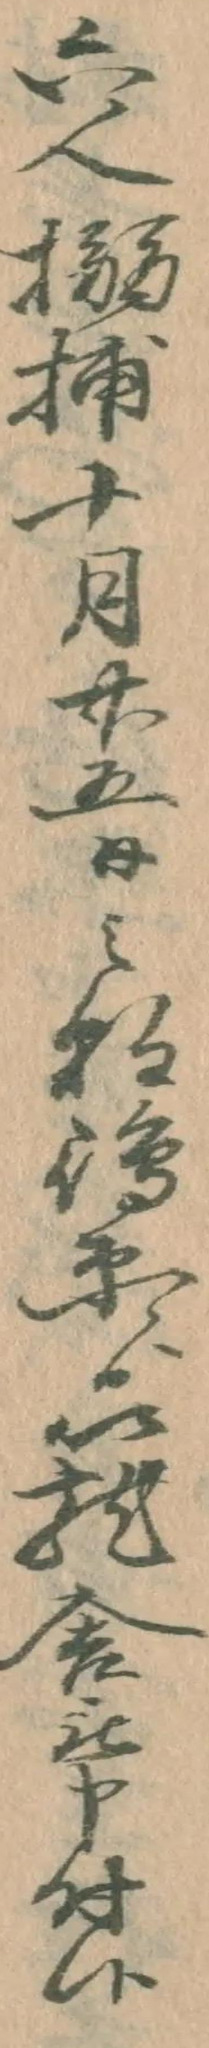六人搦捕十月廿五日之朝島原ゟ籠舎被申付候
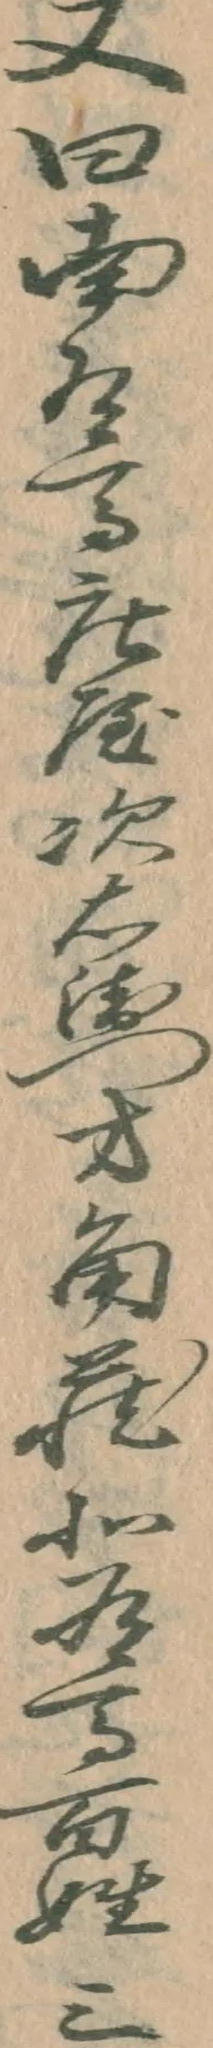又日南有馬庄屋次右衛門方角蔵北有馬百姓三
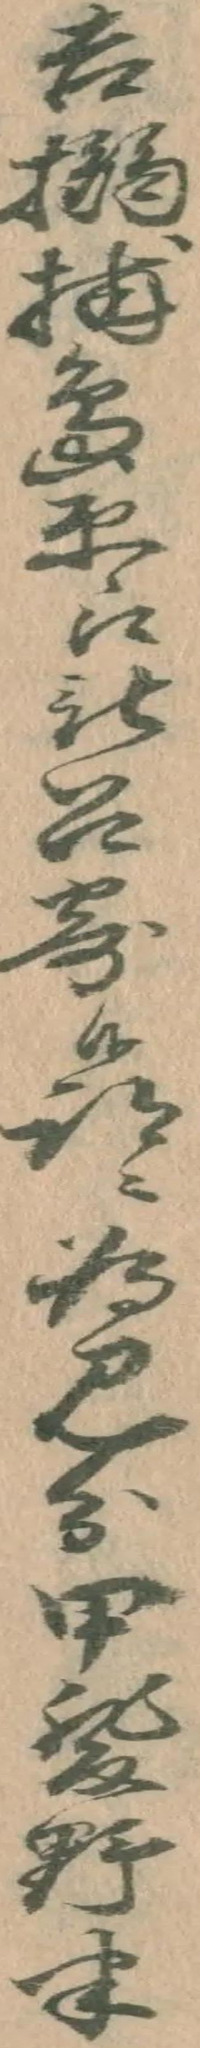吉搦捕島原え被召寄候跡に為見分甲斐野半
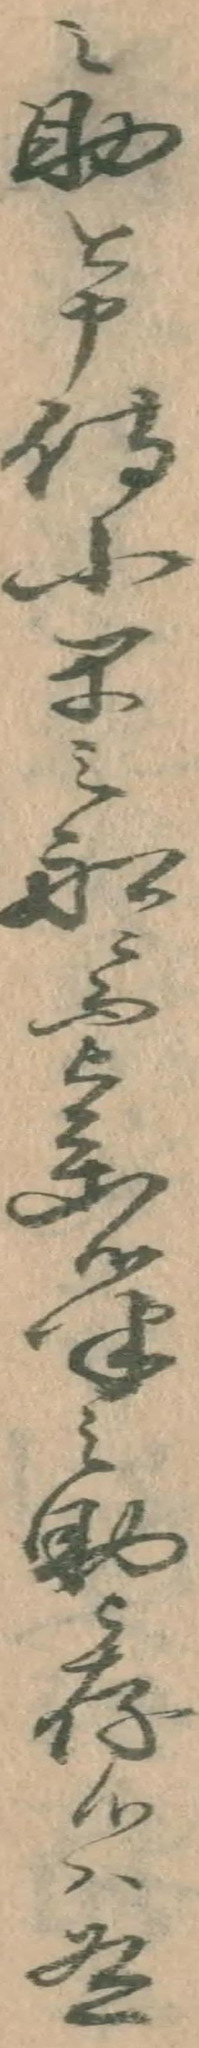之助と申侍小早之船に而被参候半之助に存候は有
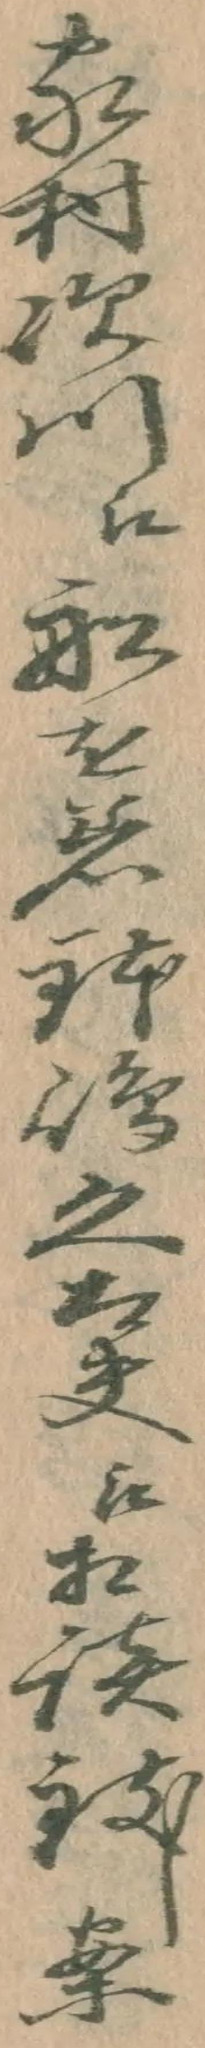家村次川え船を着鉢島久太夫え相談致し案
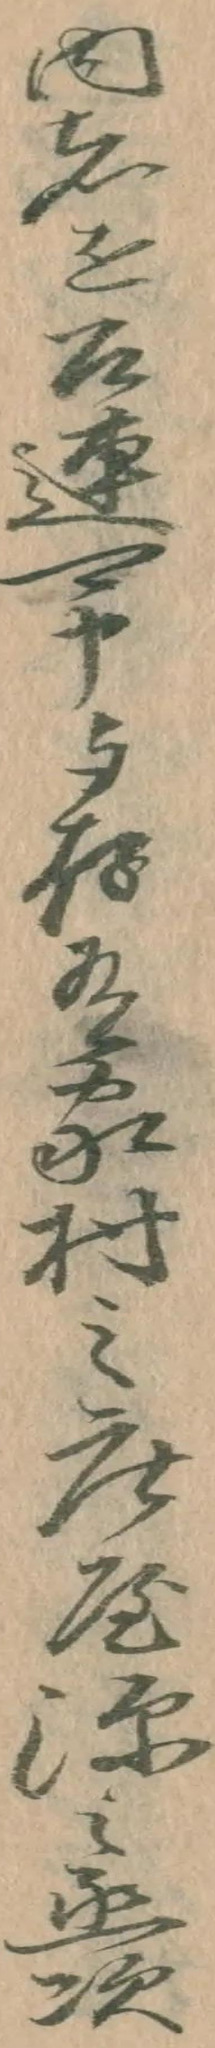内者を召連可申与存有家村之庄屋源之丞次
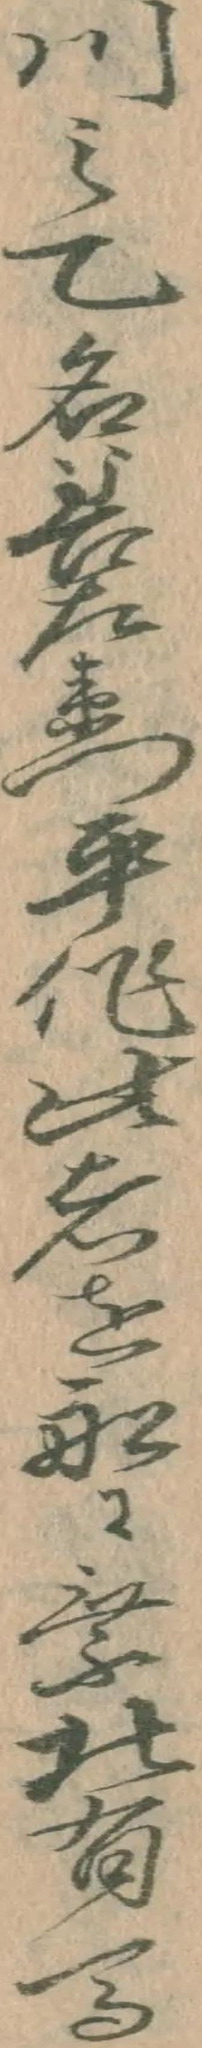川之乙名善左衛門平作此者を船に乗北有馬
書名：切支丹御退治記 49巻. [1]
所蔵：国立国会図書館 National Diet Library, JAPAN
